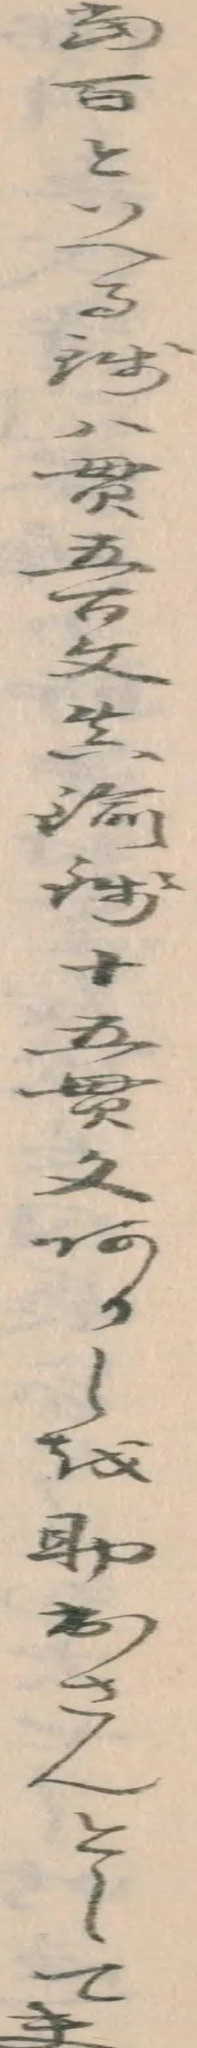当百といへる銭八貫五百文真鍮銭十五貫文ありしを助出さんとして夫
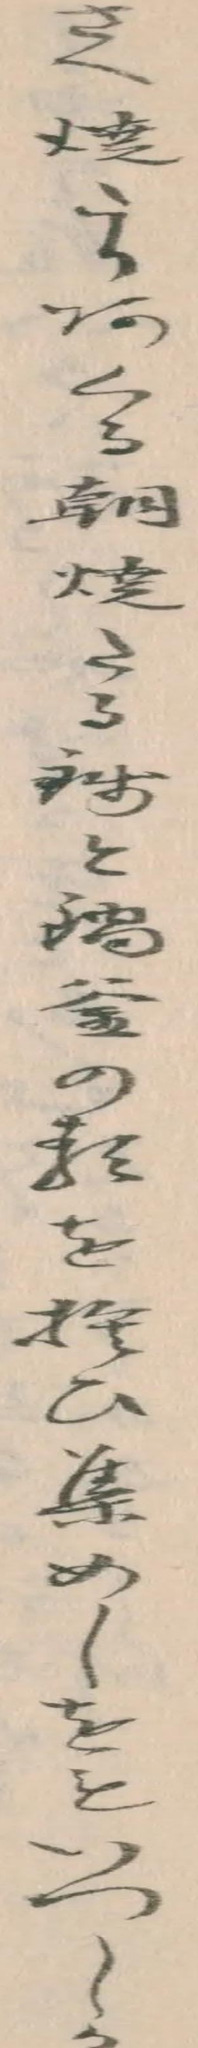さへ焼たりあくる朝焼たる銭と鍋釜の類を拾ひ集めしをもいつしか
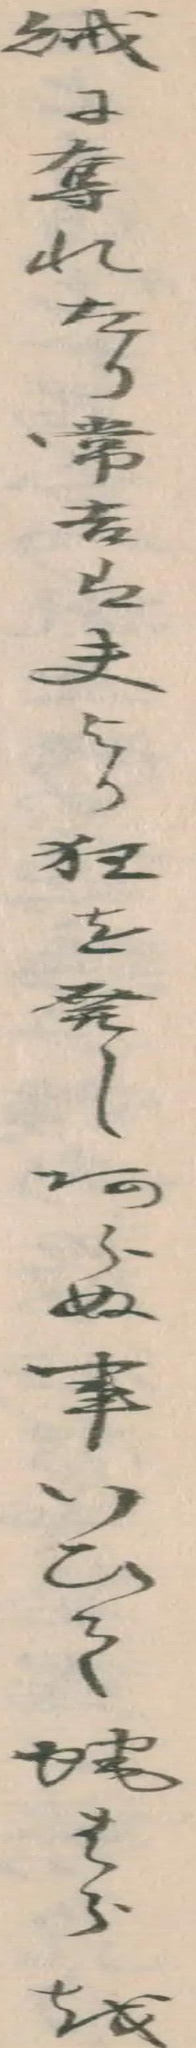賊に奪れたり常吉は夫より狂を発しあらぬ事いひて焼はらを
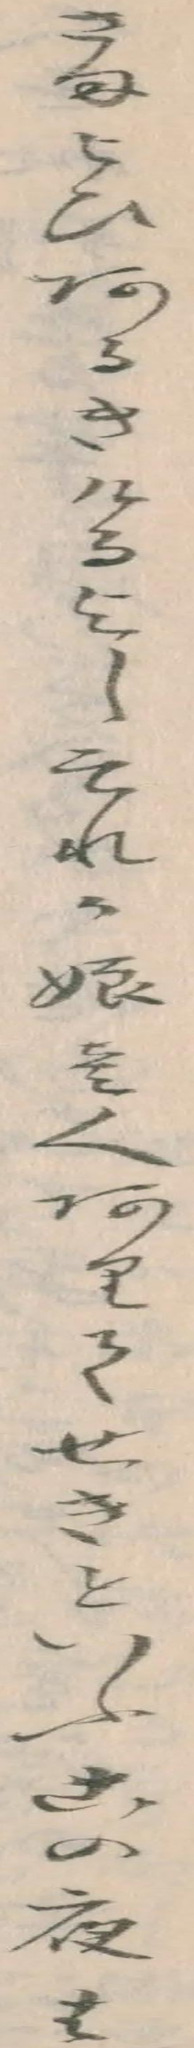さまよひあるきけるよしそれか娘壱人ありてせきといふこの夜は
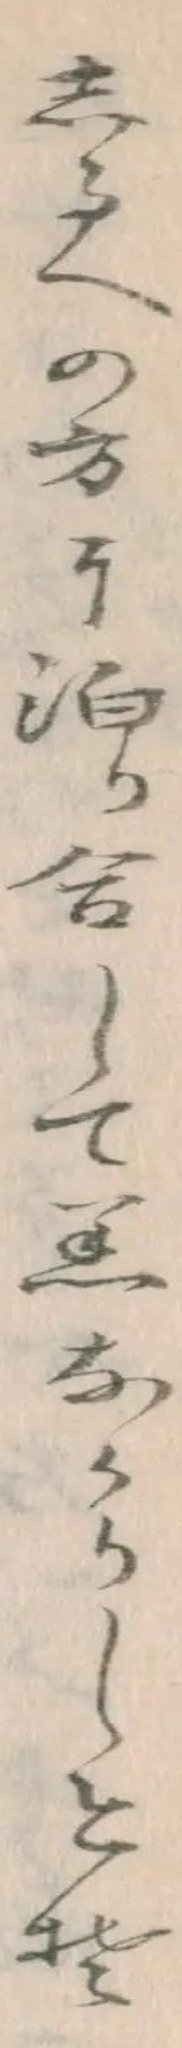しるへの方に泊り合して恙なかりしとそ
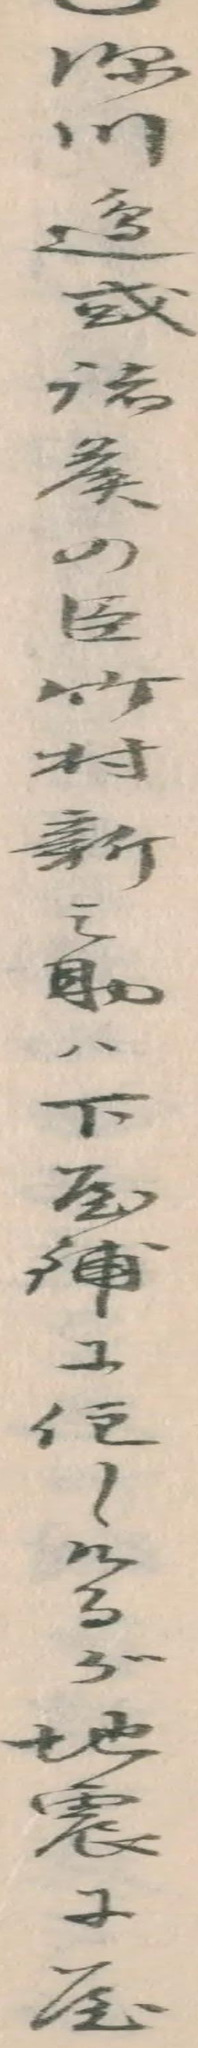〇深川辺或諸侯の臣竹村新之助は下屋鋪に住しけるが地震に屋
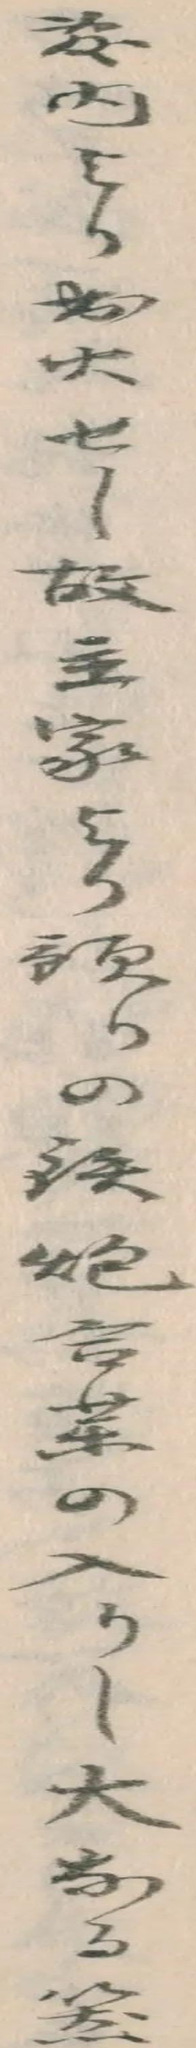敷内より出火せし故主家より預りの鉄炮合薬の入りし大なる器
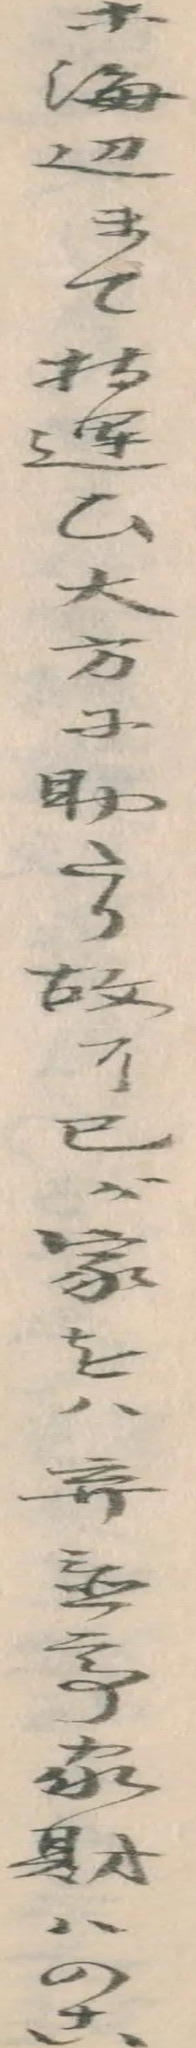等海辺まて持運ひ大方に助たり故に己が家をは棄置て家財はのこ
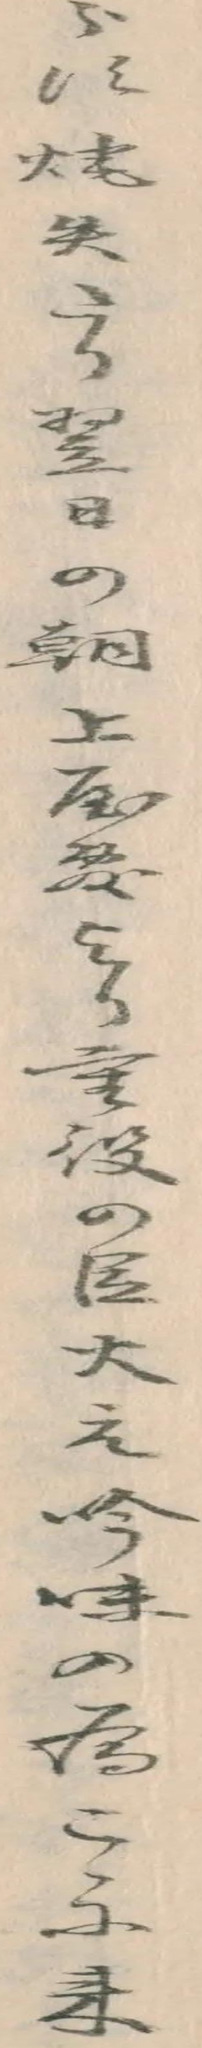らす焼失たり翌日の朝上屋敷より重役の臣火元吟味の為こゝに来

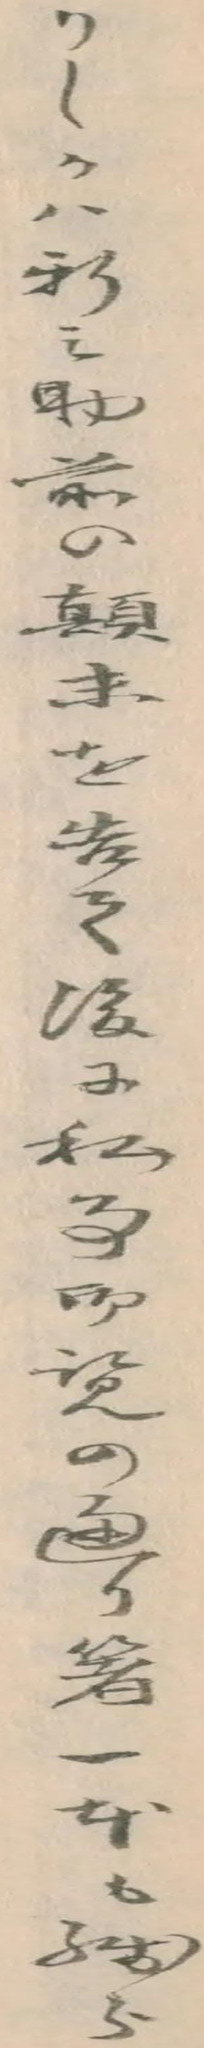りしかは新之助前の顛末を告て後に私事御覧の通り箸一本も残ら
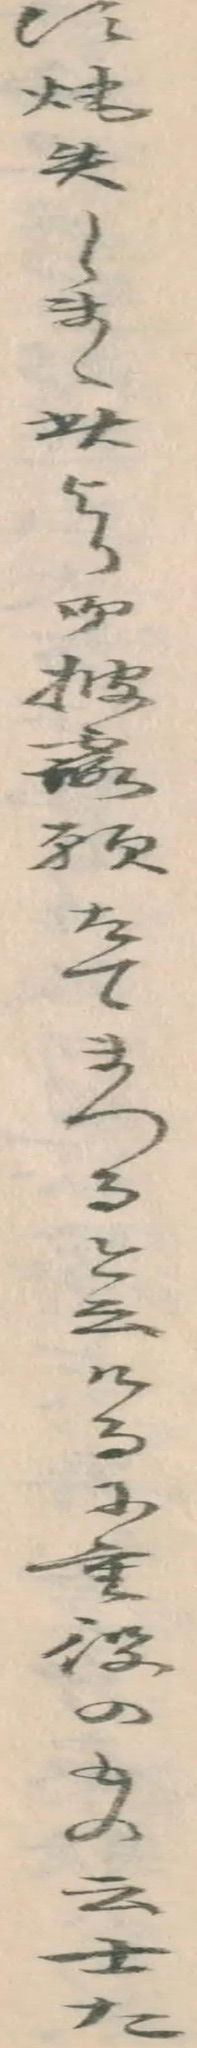す焼失しまゝ此より御披露願たてまつると云けるに重役のもの云士た
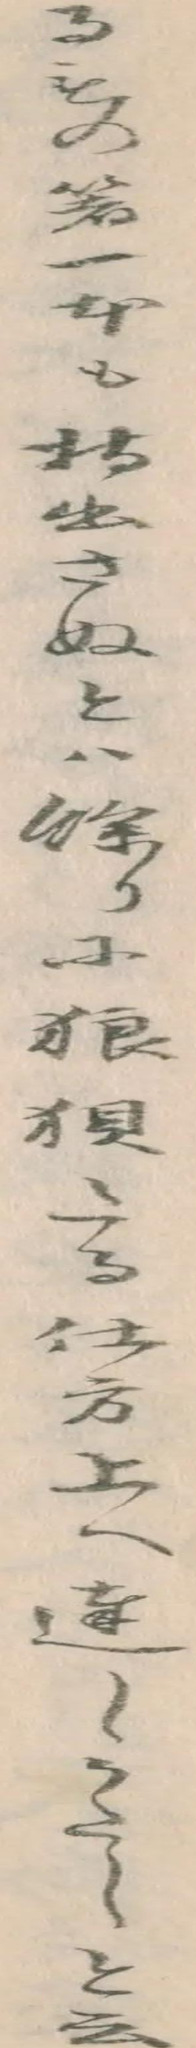るもの箸一本も持出さぬとは余りに狼狽たる仕方上へ達しかたしと云
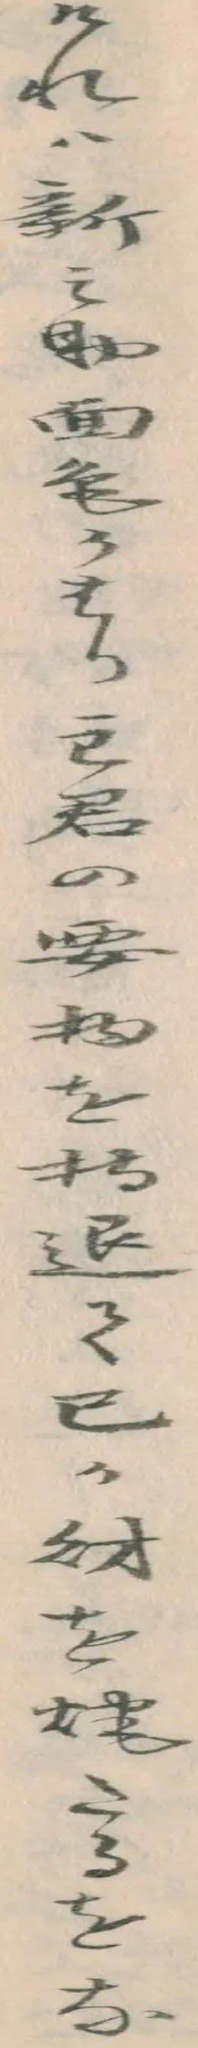けれは新之助面色かはり主君の要物を持退て己か財を焼たるをな
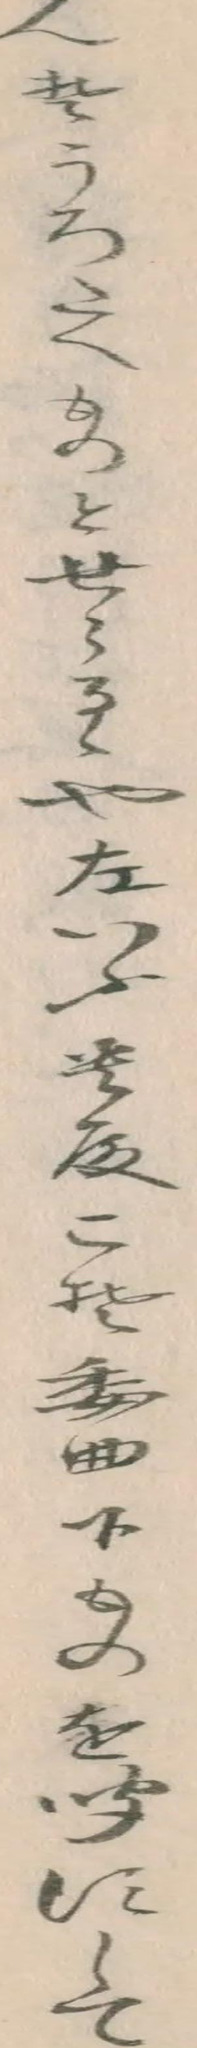んそうろたへものとせくるゝや左いふ貴殿こそ委曲下ものを聞すして
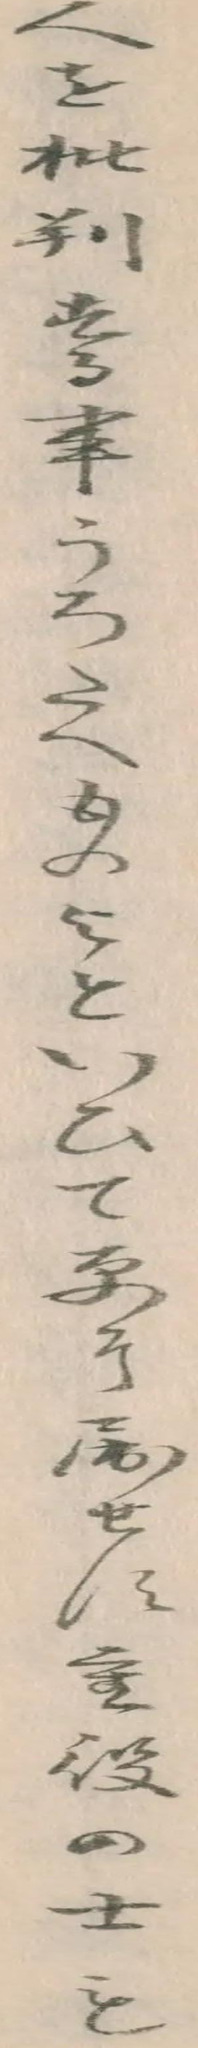人を批判する事うろたへものよといひて更に屈せす重役の士も
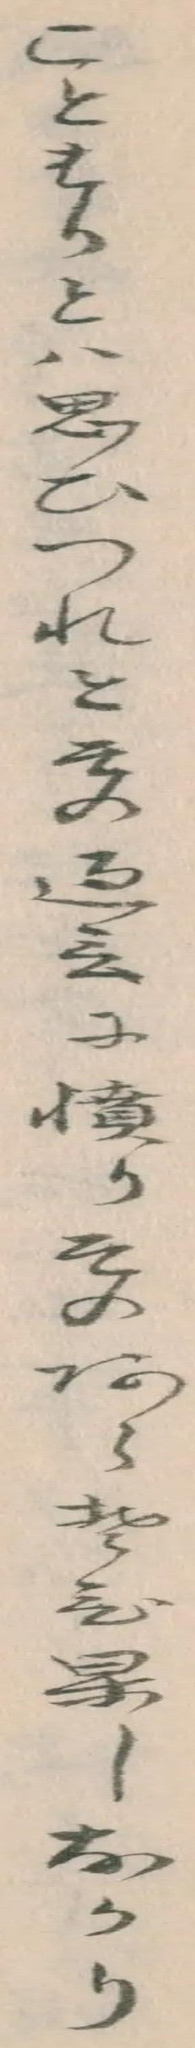ことはりとは思ひつれとその過言に憤りそのあらそひ果しなかり
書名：地災撮要. 巻10(地震之部) 上,下
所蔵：国立国会図書館 National Diet Library, JAPAN
